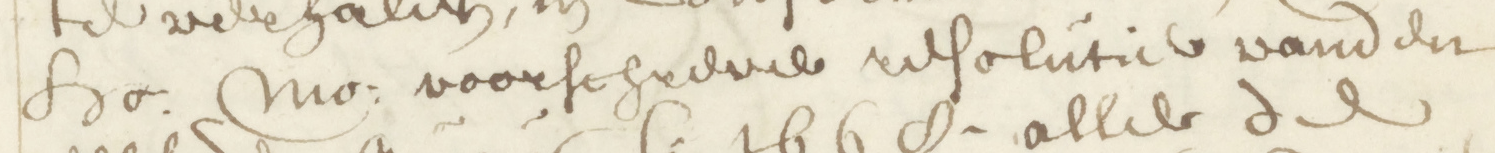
Ho:Mo: voorschreve resolutie vanden
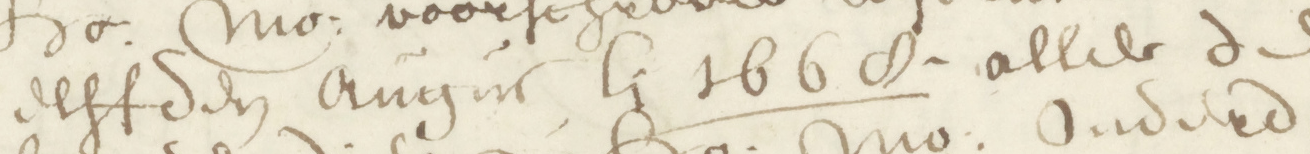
elffden Augusti 1668, alle de
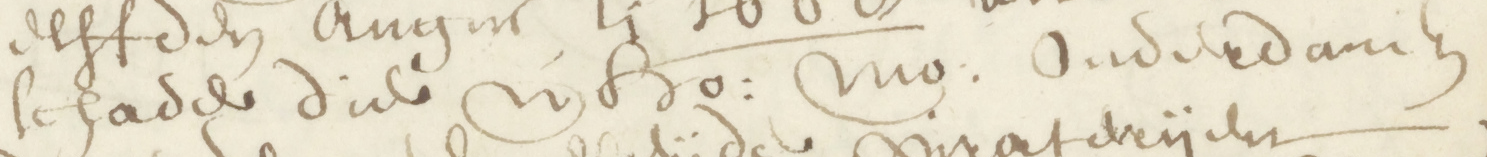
schade die U Ho:Mo: Onderdanen
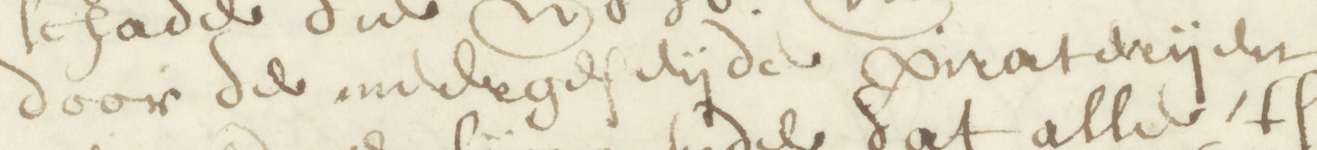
door de meergeseijde piraterijen
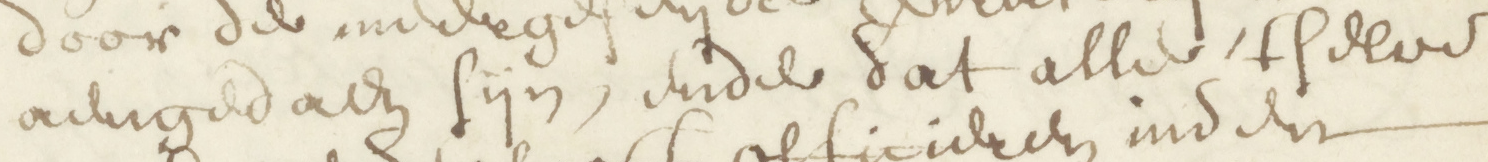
aengedaen sijn, ende dat alle ‛tselve
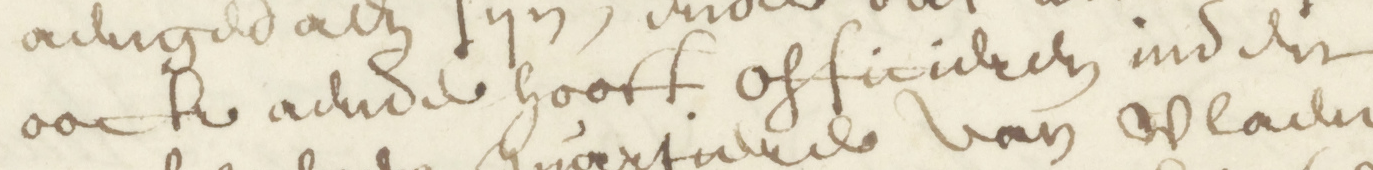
oock aende hooft Officieren inden
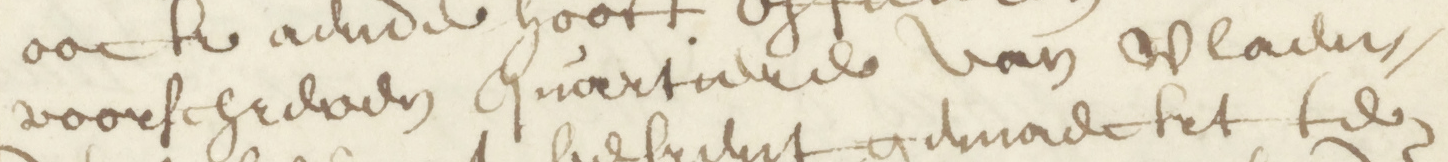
voorschreven Quartiere van Vlaen„
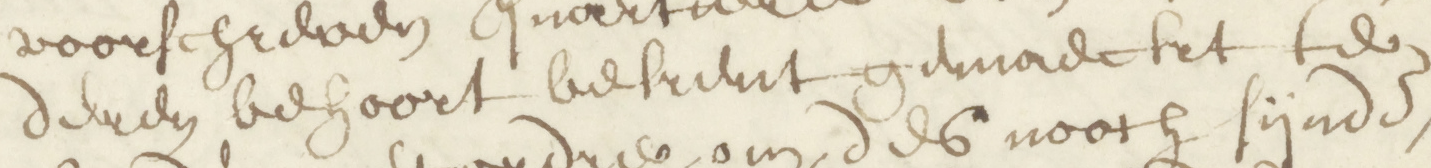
deren behoort bekent gemaeckt te
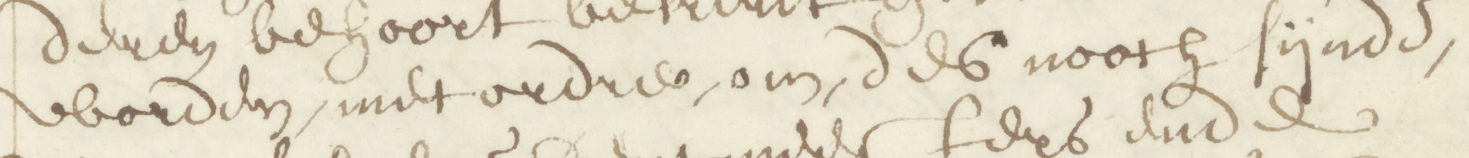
worden, met ordre, om, des nooth sijnde,
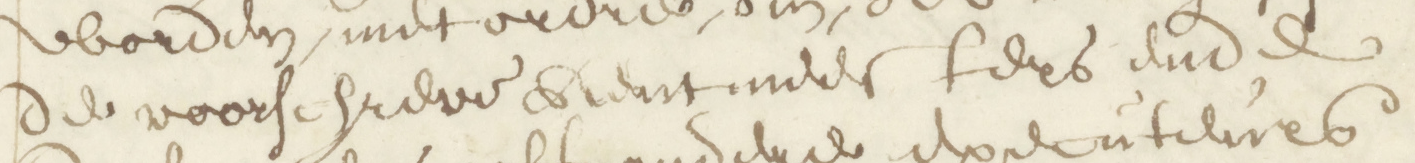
de voorschreve Rentmeesters ende
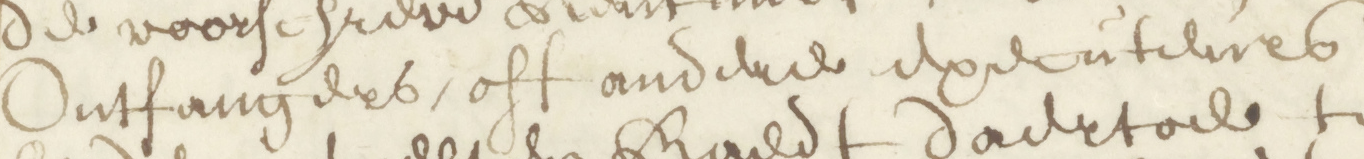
Ontfangers oft andere executeurs
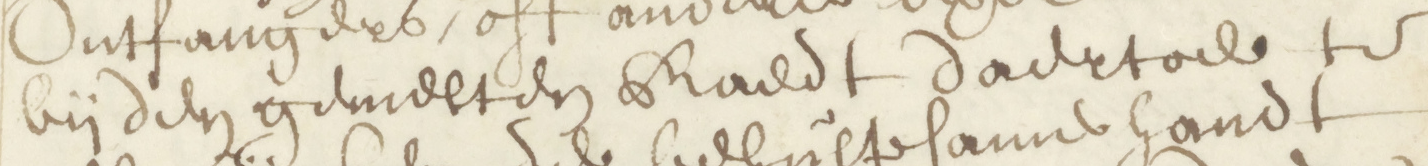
bij den gemelten Raedt daertoe te
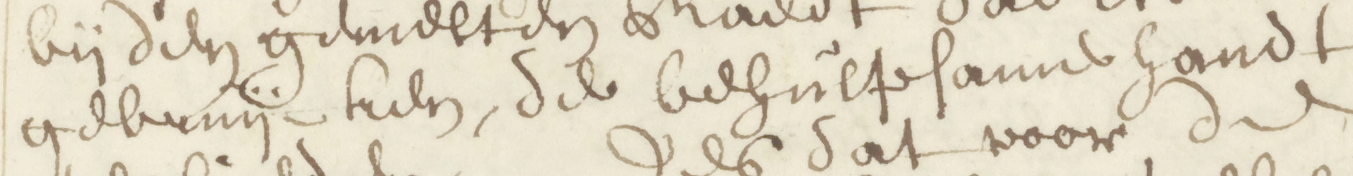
gebruijcken, de behulpsame handt
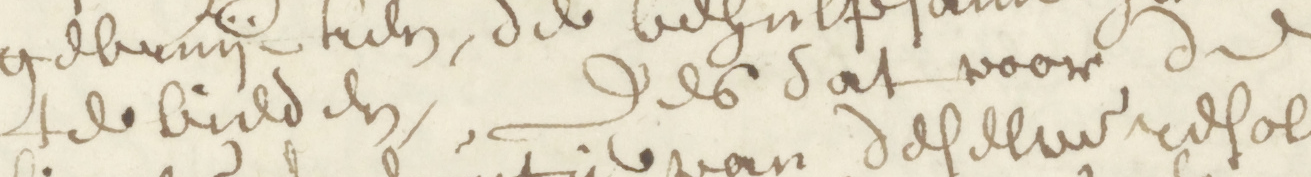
te bieden. Des dat voor de
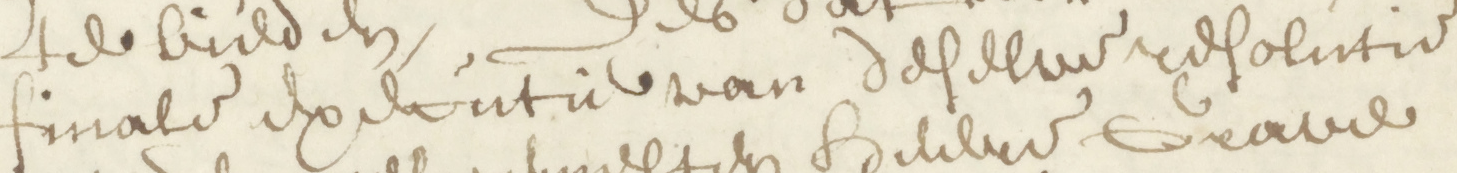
finale executie van deselve resolutie
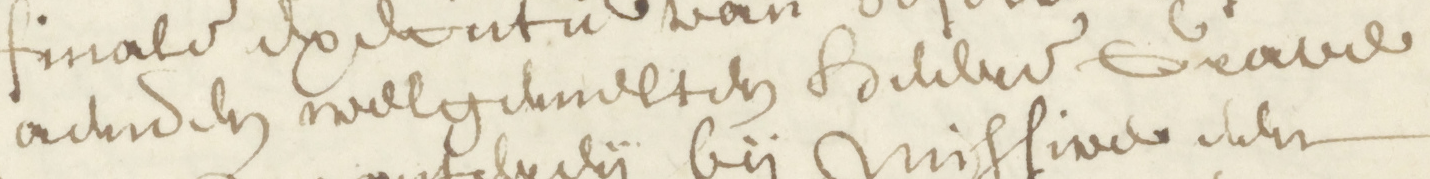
aenden welgemelten Heere Grave
